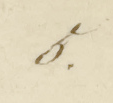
6.
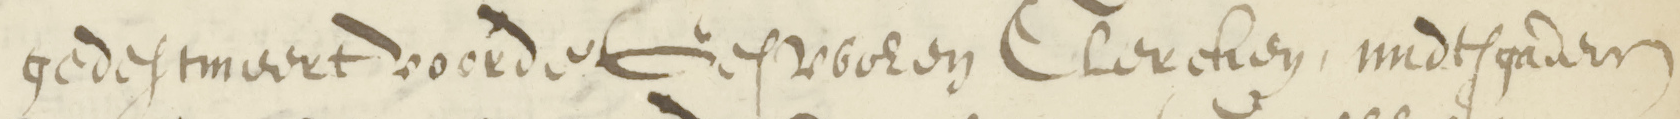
gedestineert voor de Gesworen Clercken, midtsgaders
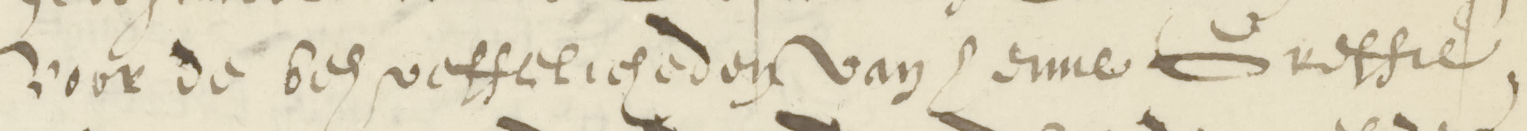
voor de behoeffelicheden van heure Greffie
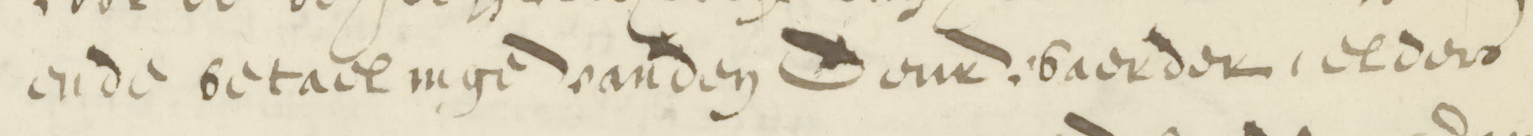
ende betaelinge vanden Deurwaerder, elders
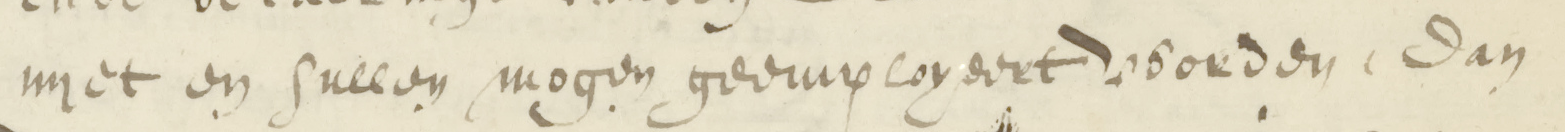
nyet en sullen mogen geemployeert worden, dan
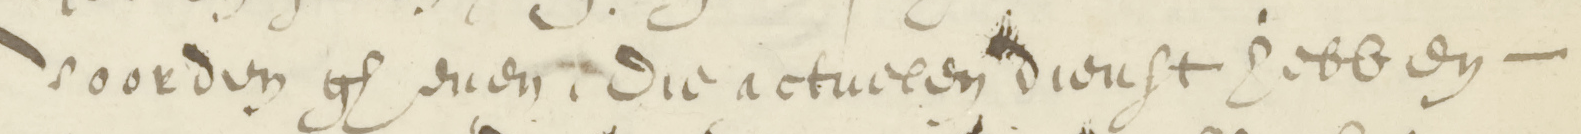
voorden ghenen, die actuelen dienst hebben -
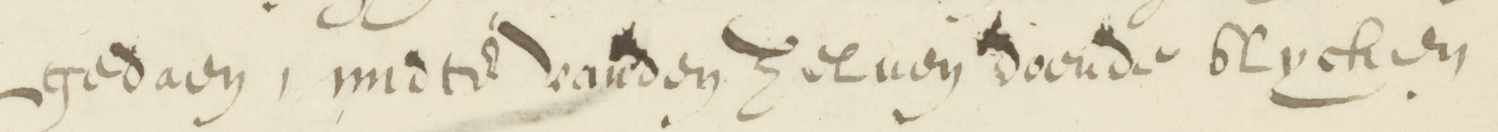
gedaen, midts vanden zelven doende blycken
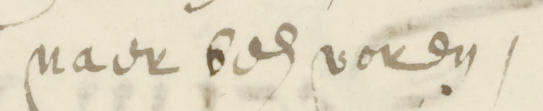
naer behooren.
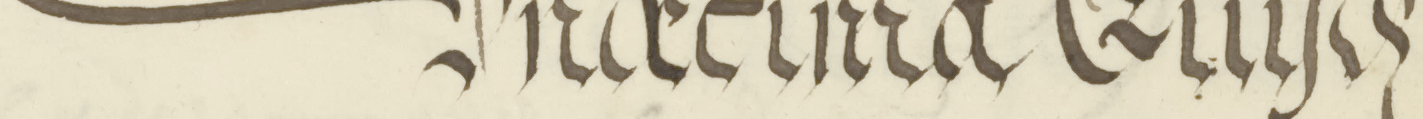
Undecima Eiusd
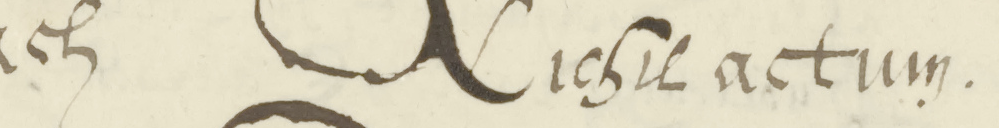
Sondach Nihil actum
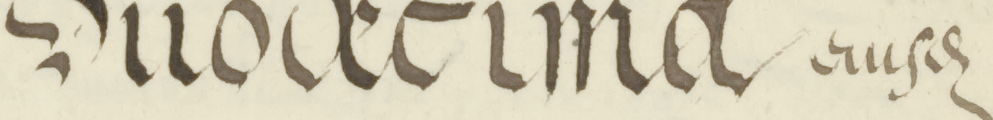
Duodecima eiusd
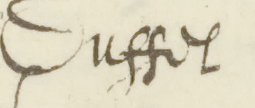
Duffel
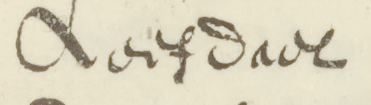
Leefdael
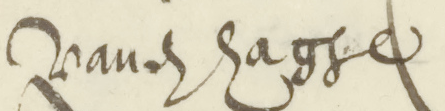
Vanden Haghe
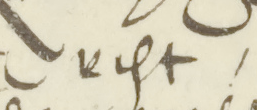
Trist
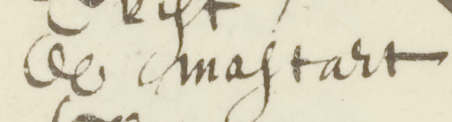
de Mastaert
